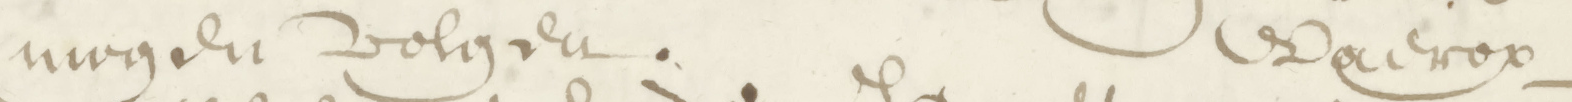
mogen volgen. Waerop
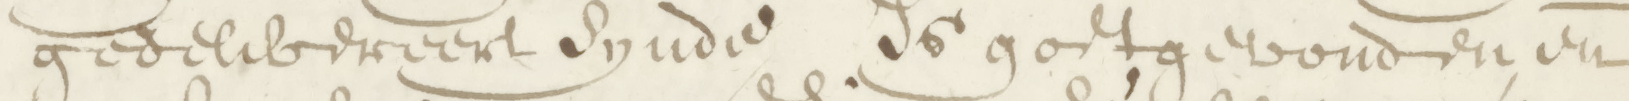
gedelibereert sijnde, is goetgevondenen en
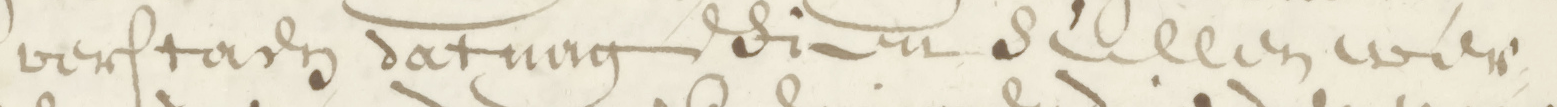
verstaen dat nagesien sullen wer,
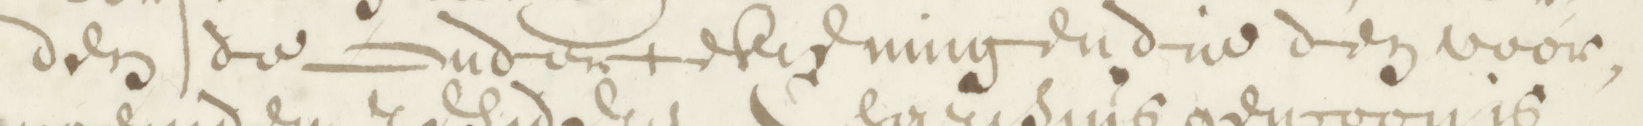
den de Ondertekeningen die den voor„
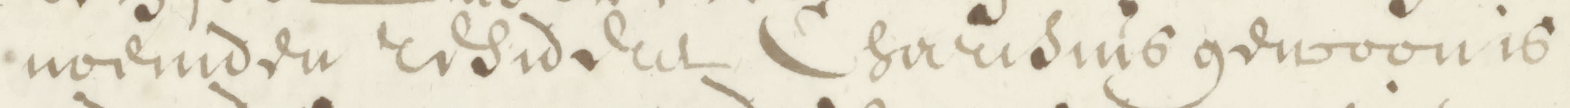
noemden resident Charisuis gewoon is
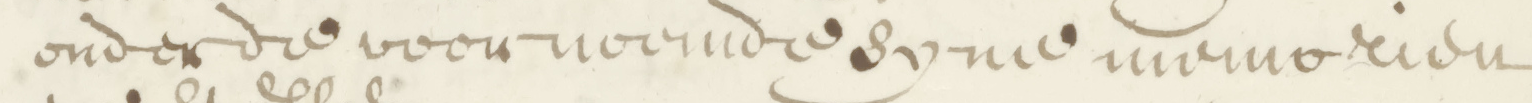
onder de voornoemde syne memorien
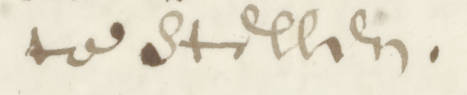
te stellen.
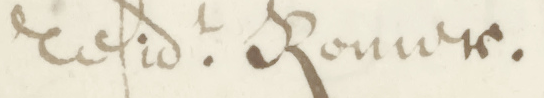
residt. Romer,
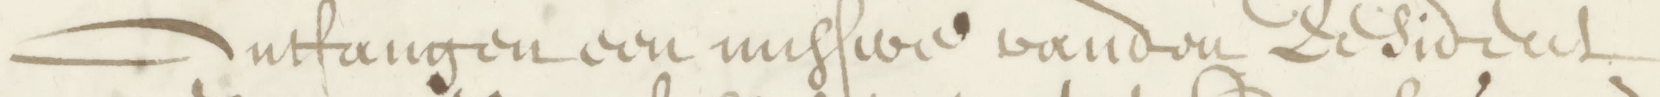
Ontfangen een missive vanden Resident
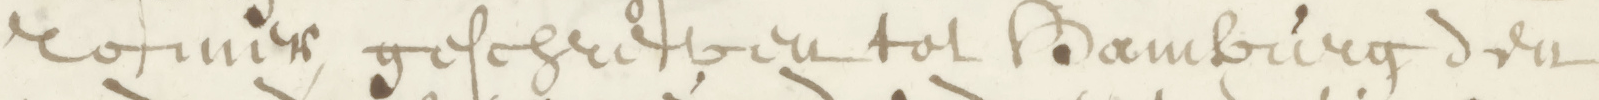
Romer, geschreven tot Hamburg den
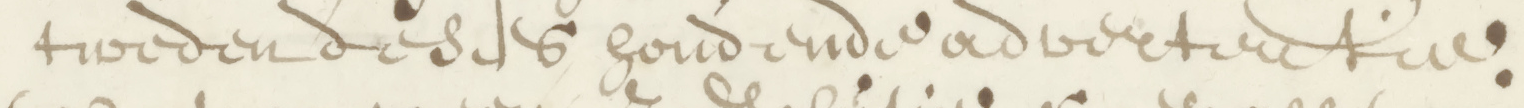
tweden deses houdende advertentie
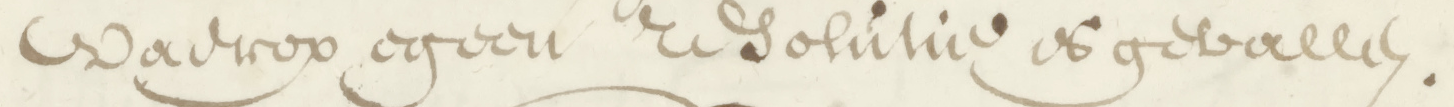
Waerop egeen resolutie is gevallen.
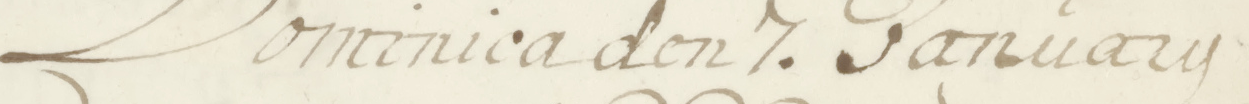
Dominica den 7. January
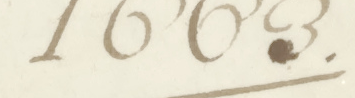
1663.
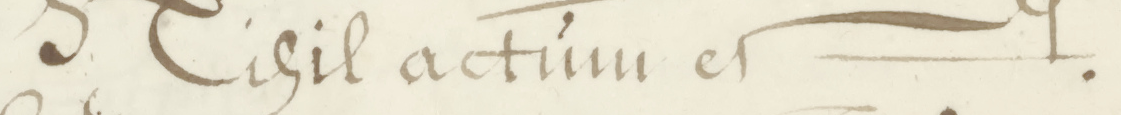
Nihil actum est
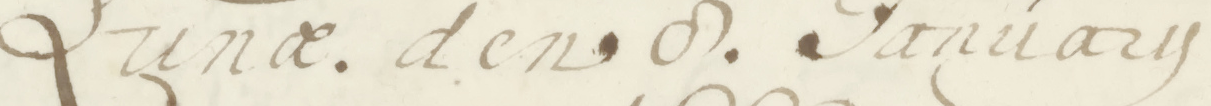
Liunæ. den 8. Januarij
